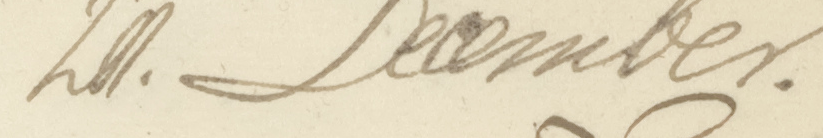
28 December.
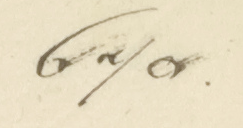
678.
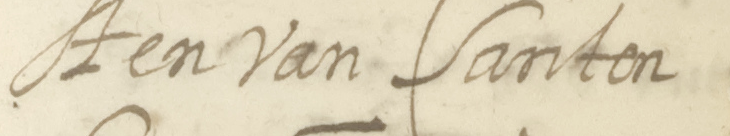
Aen van Santen
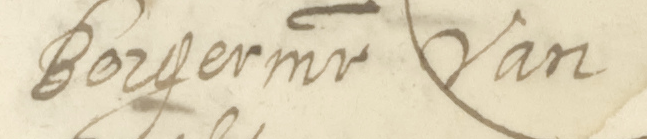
Borgermr van
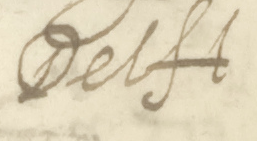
Delft
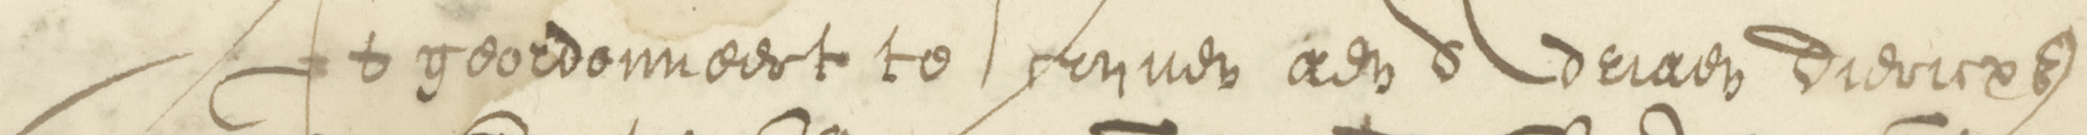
Is geordonneert te scryuen aen Adriaen Diericxz
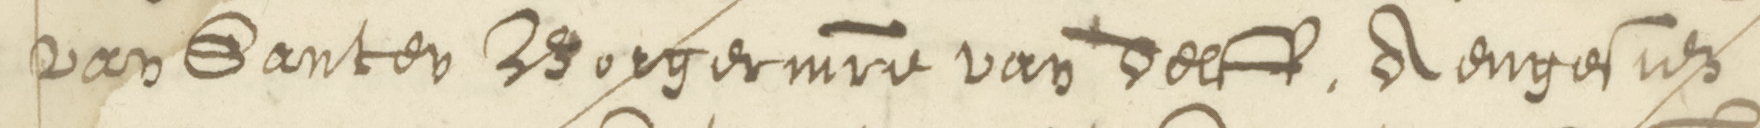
van Santen Borgermre van Delft, Aengesien
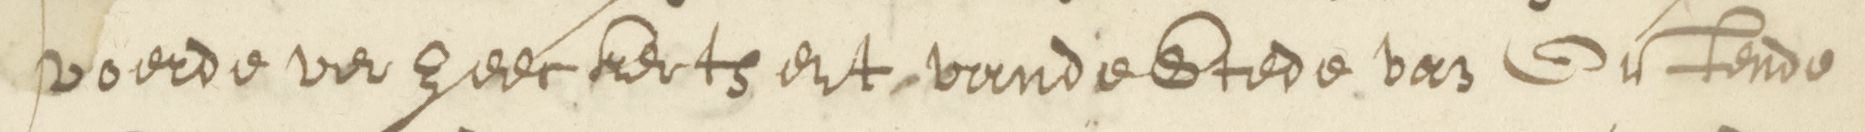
voerde verzeeckertheyt, vande Stede van Oistende
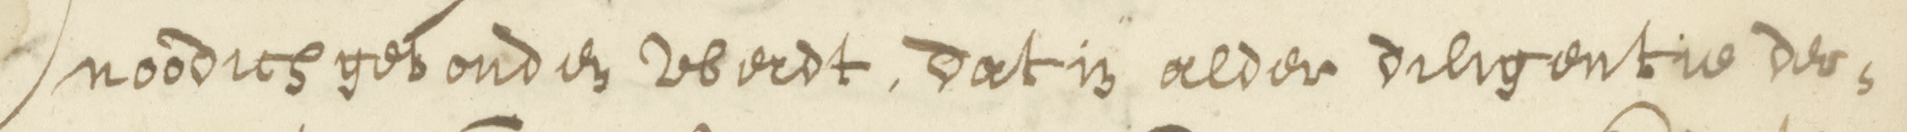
noodich gevonden werdt, dat in alder diligentie der„
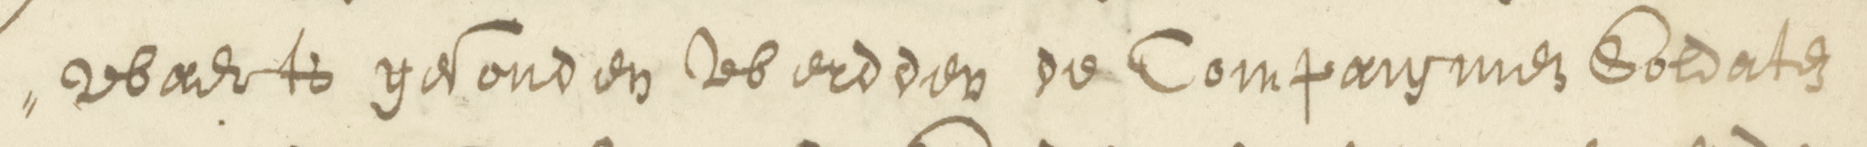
„waerts gesonden werdden de Compaignien Soldaten
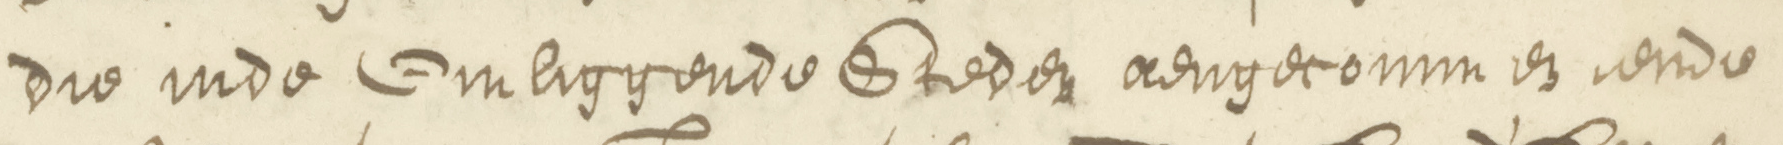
die inde Omliggende Steden aengecommen ende
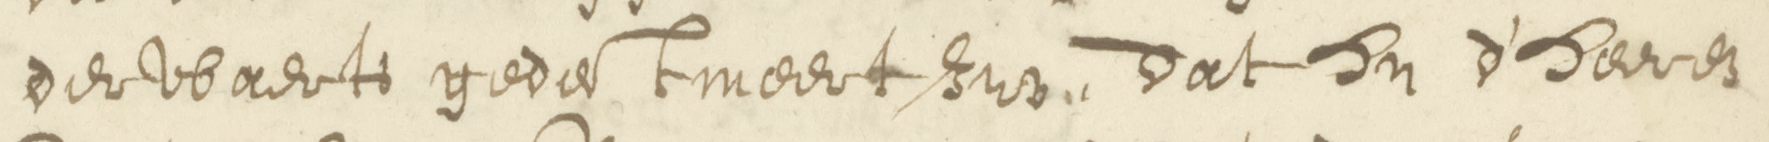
derwaerts gedestineert zyn, dat hy d‛heeren
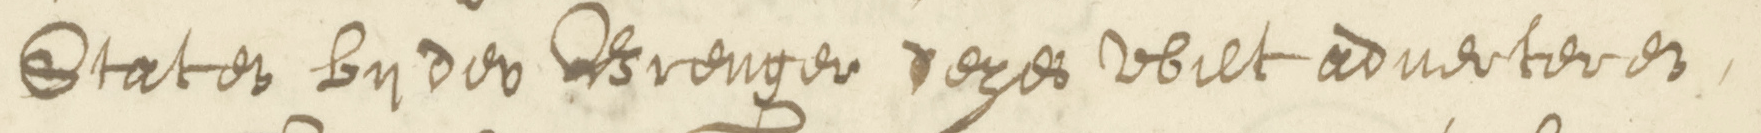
Staten by den Brenger dezes wilt aduerteren,
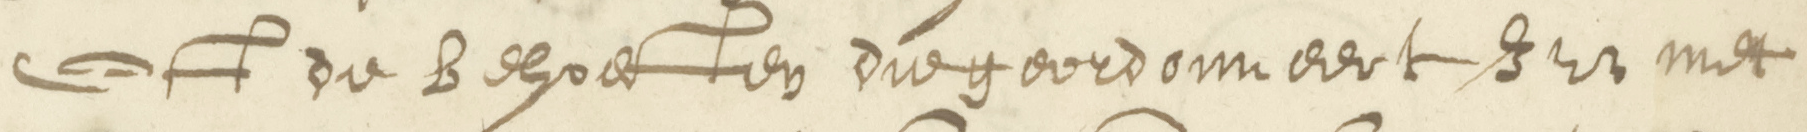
Off de behoeften die geordonneert zyn met
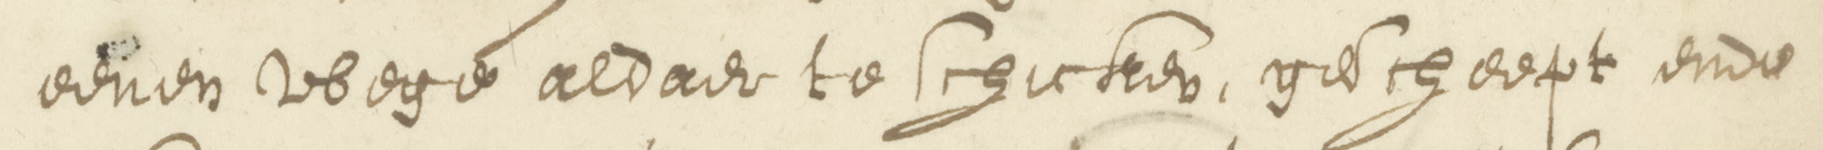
eenen wege aldaer te schicken, gescheept ende
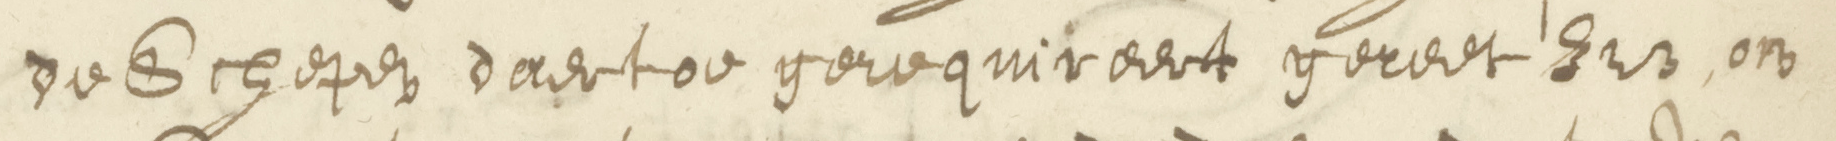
de Schepen daertoe gerequireert gereet zyn, om
